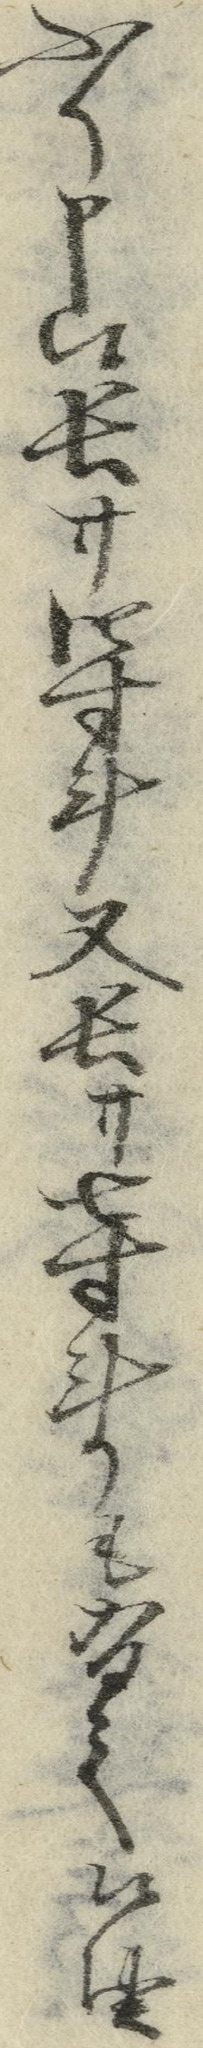ふり申候長サ四寸斗又長サ七寸斗りも有之候由
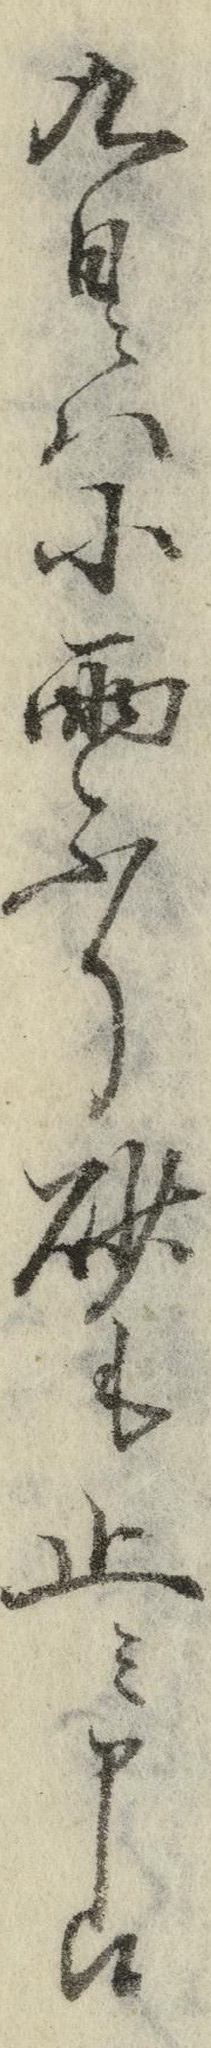九日ニハ小雨ふり砂も止ミ申候
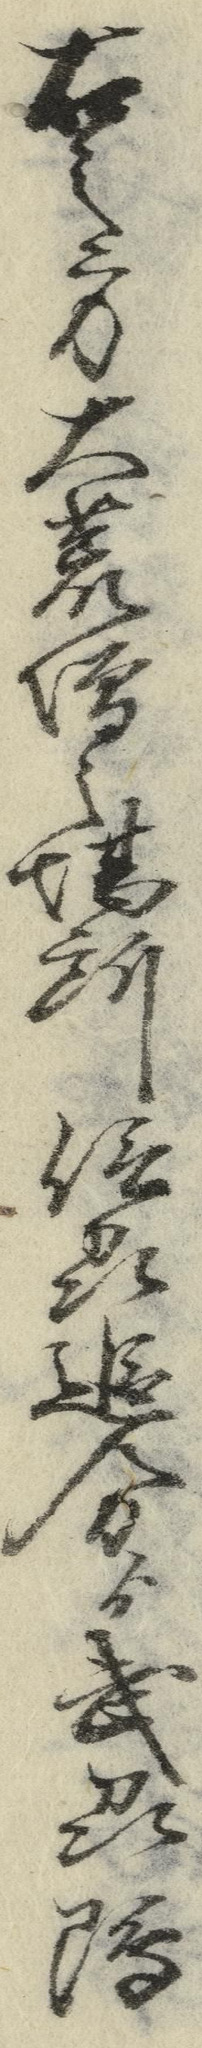右之方大荒増之場所信州追分ゟ武州鴻
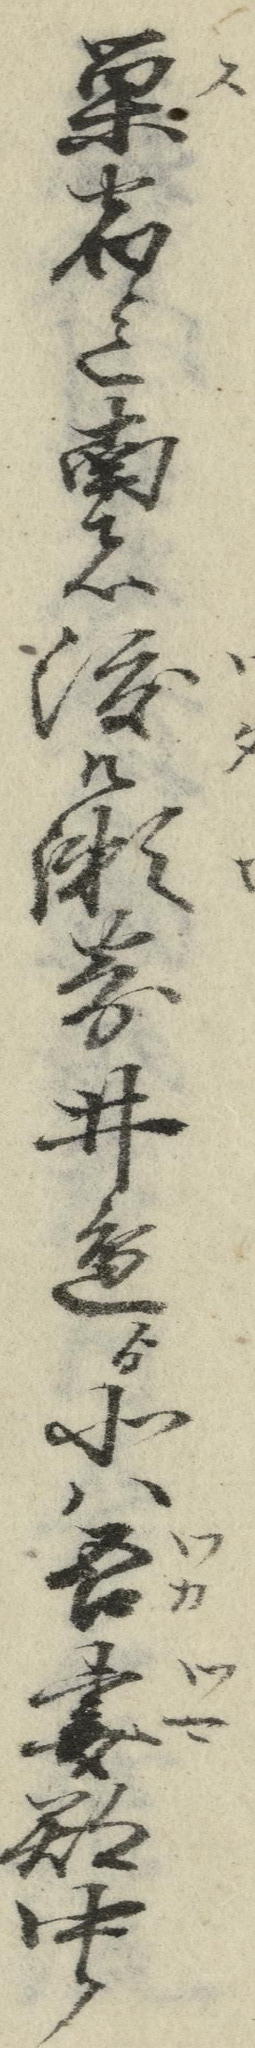巣宿迄南は渡ル瀬寄井辺ゟ北ハ吾妻郡中ノ
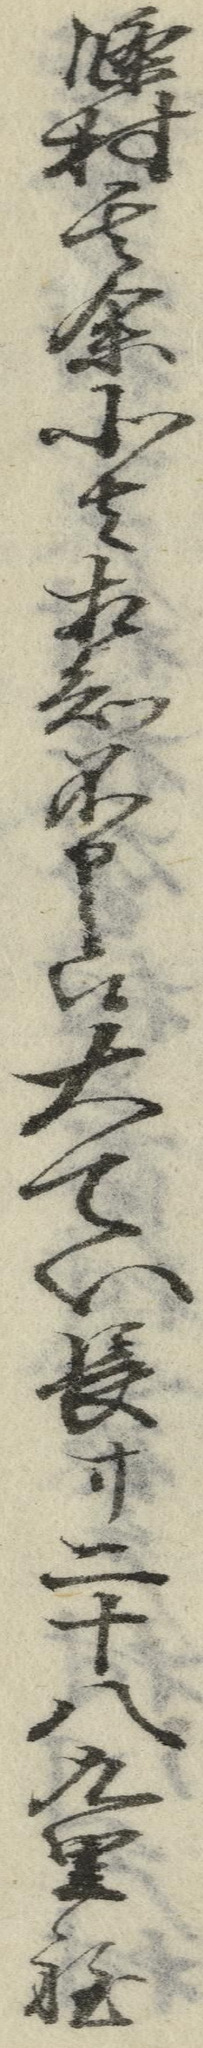條村其余北は相知不申候大てい長サ二十八九里程
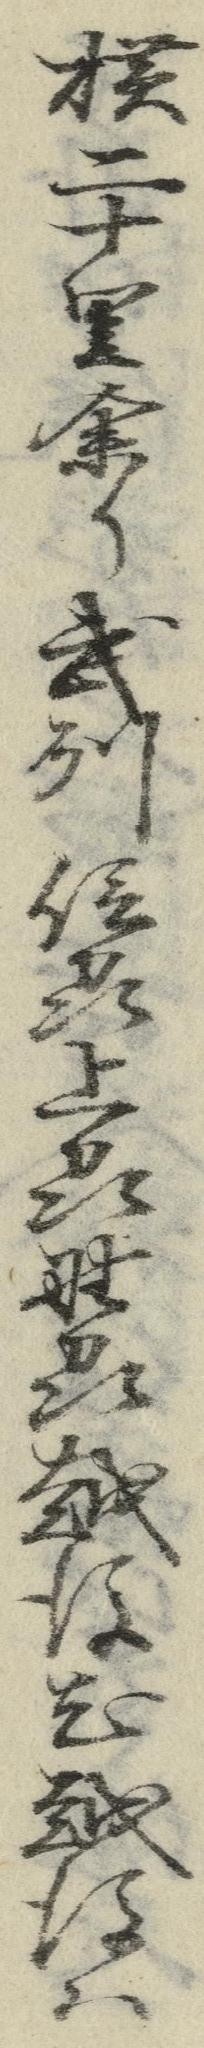横二十里余り武州信州上州野州越後尤越後ハ
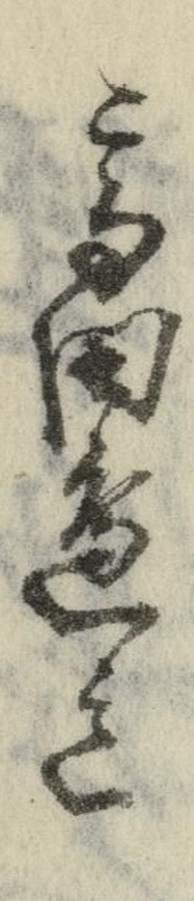高田辺迄
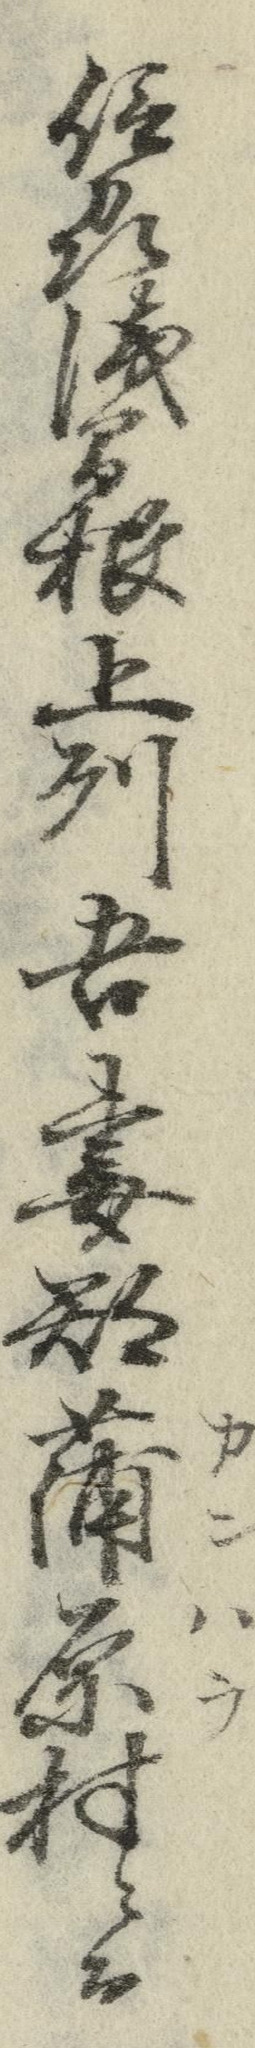信州浅間根上州吾妻郡蒲原村ニ而
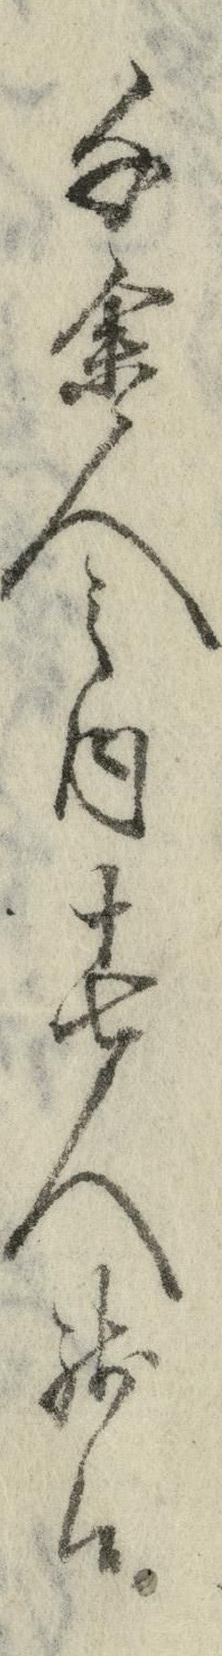千余人之内十七人残候
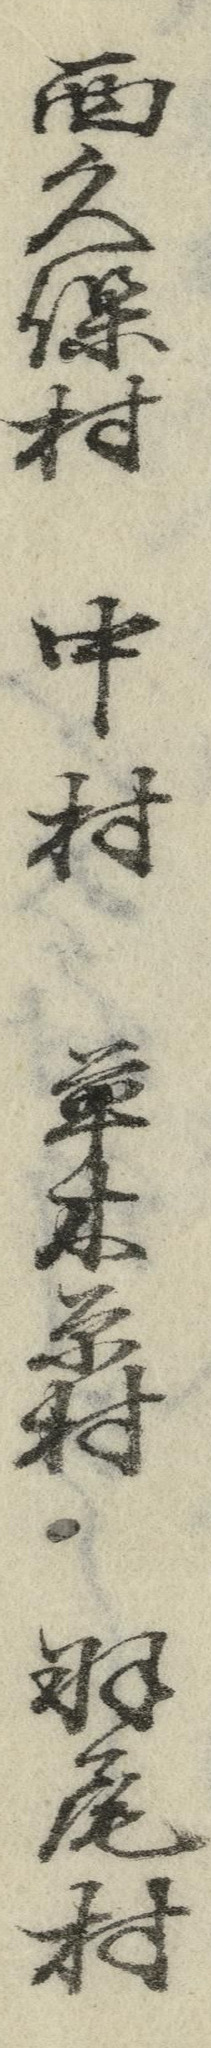西久保村中村草木原村羽尾村
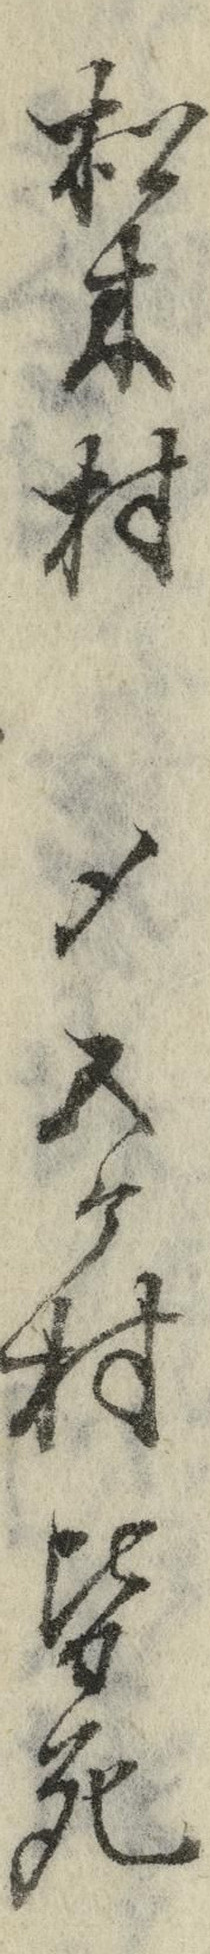松木村〆五ヶ村皆死

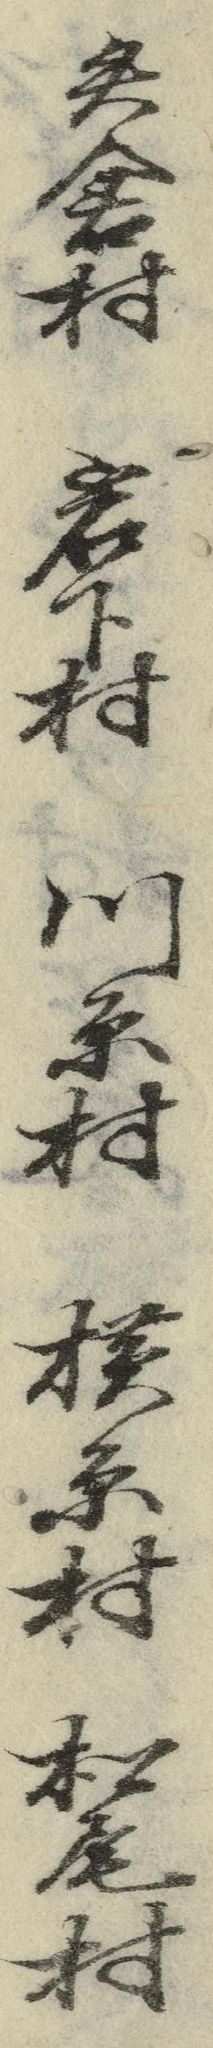矢倉村岩下村川原村横原村松尾村
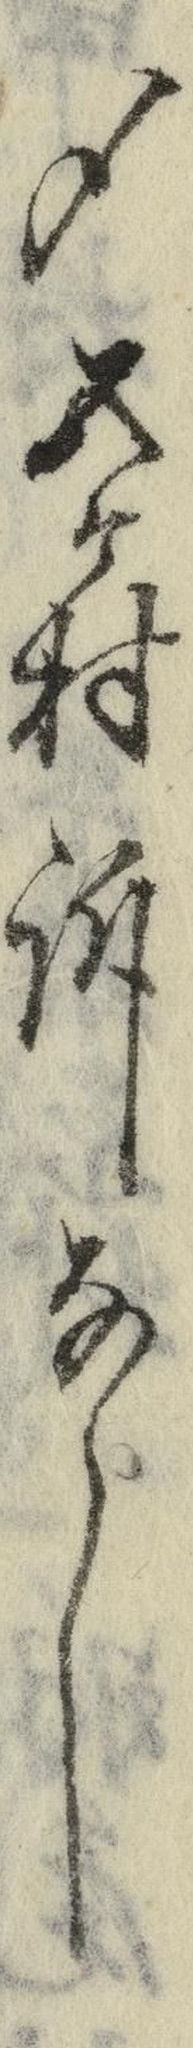〆五ヶ村訴なし
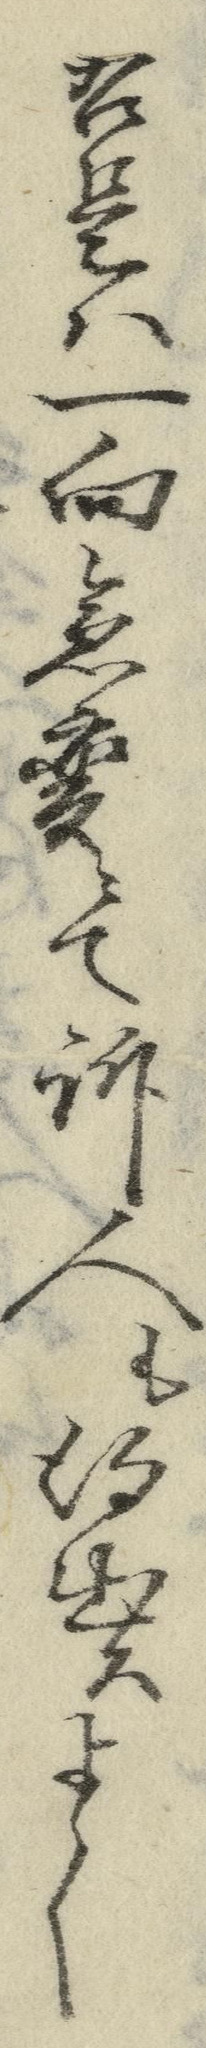右是ハ一向急変ニて訴人も得出スよし
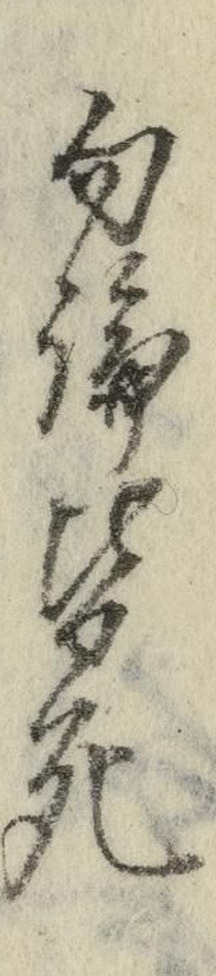勿論皆死
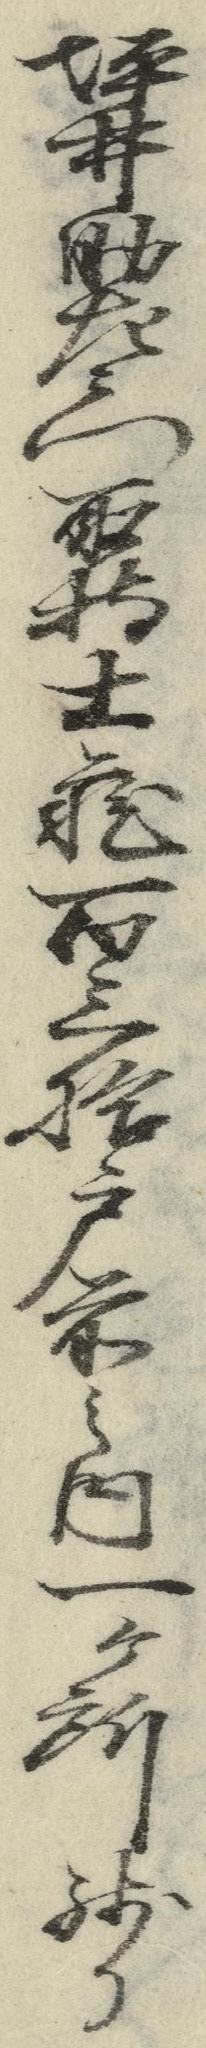坪井助左衛門所持土蔵百三拾戸前之内一ヶ所残り
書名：信州浅間山焼
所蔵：東京大学地震研究所図書室 Earthquake Research Institute Library, The University of Tokyo, JAPAN
